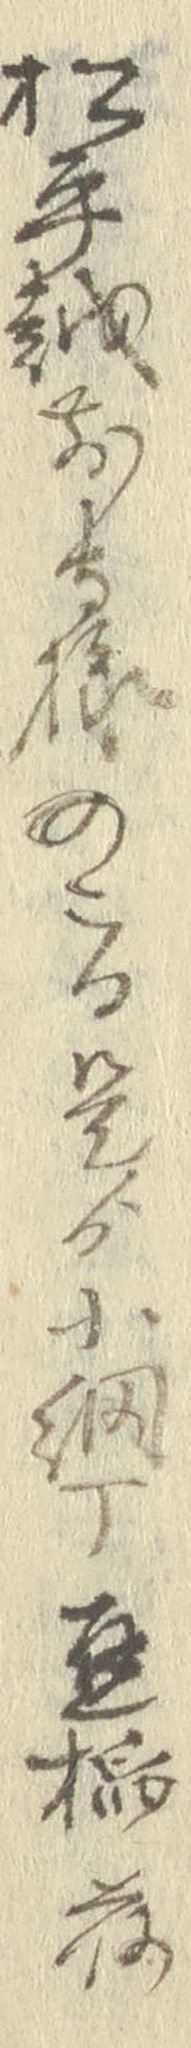松平越前守様のこる是ゟ小網丁通稲荷
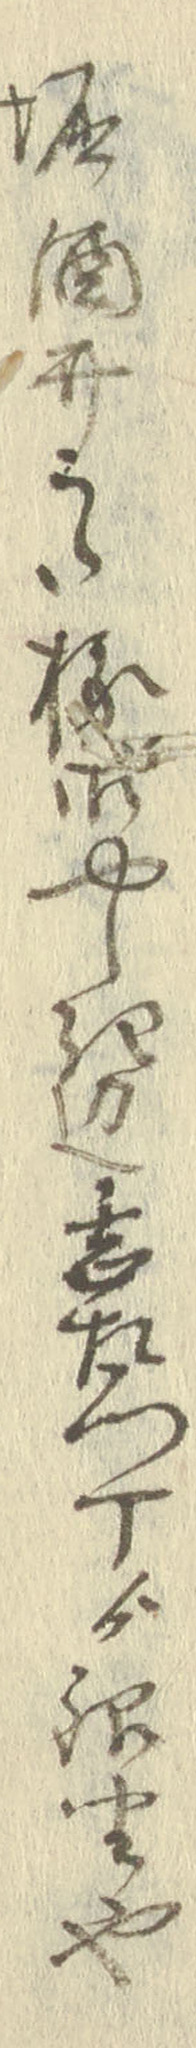堀酒井うた様おやき辺甚左エ門丁ゟ銀坐や
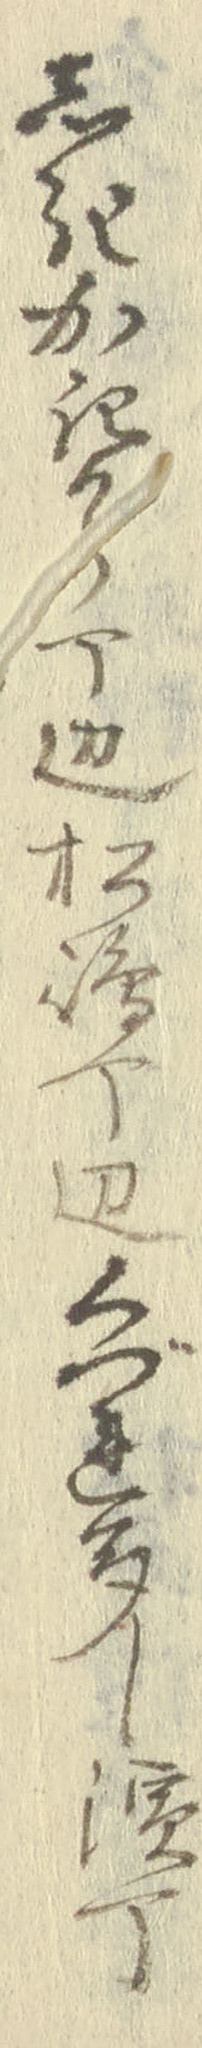しきかきから丁辺松嶋丁辺くづれ多し濱丁
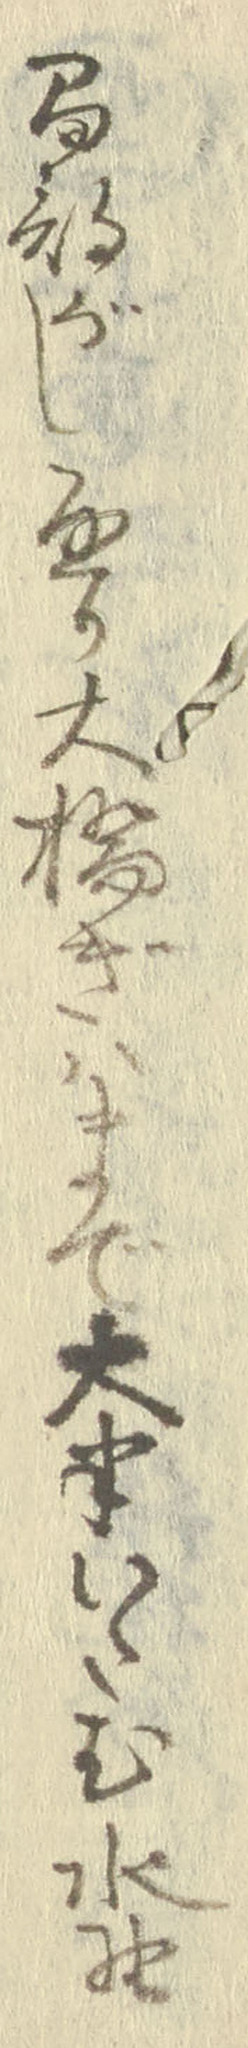間部がし通り大橋ぎハまて大半いたむ水野
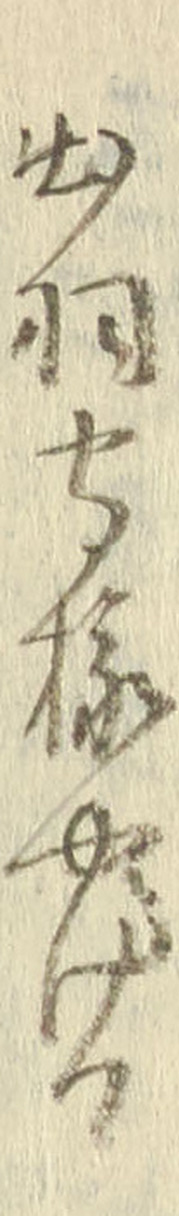出羽守様やける
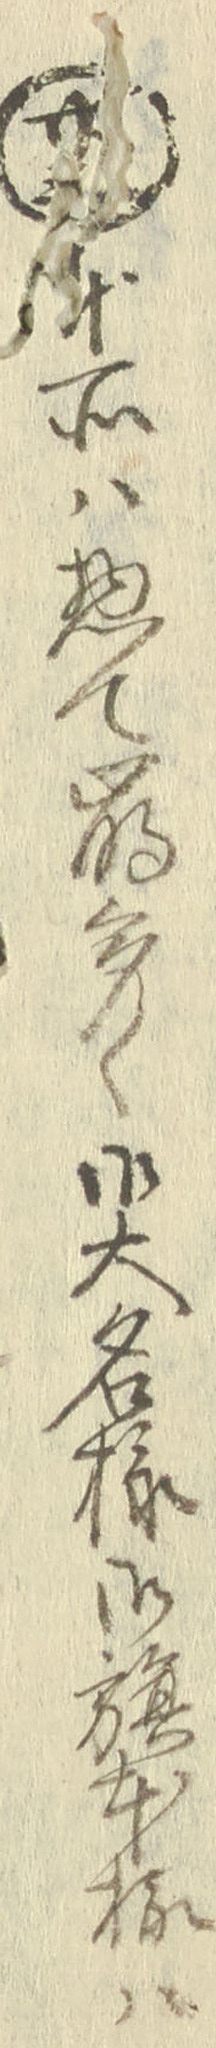廿三本所ハ惣て崩多く御大名様御旗本様ハ
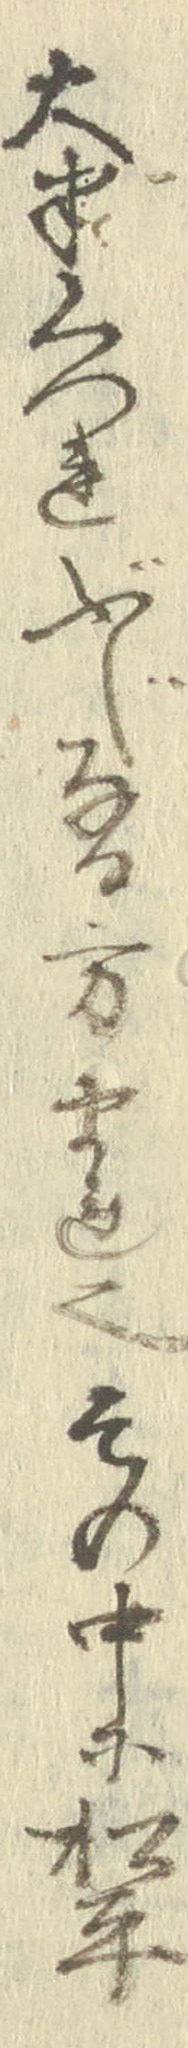大半くつれぶじなる方まれ也その中に松平
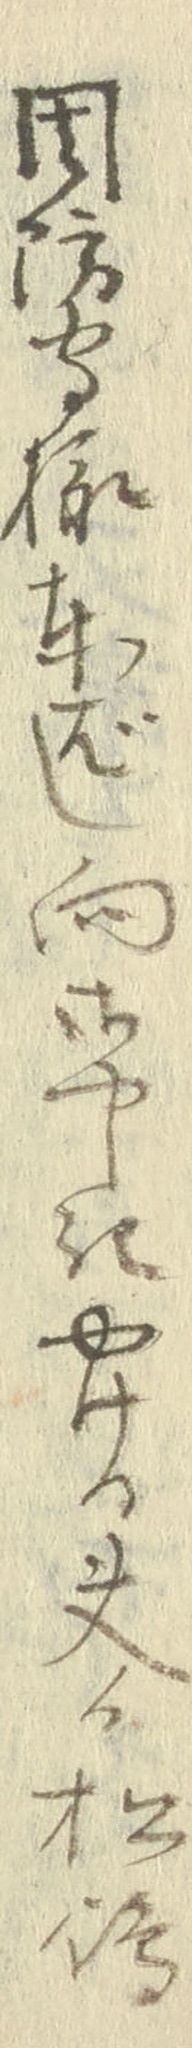周防守様本ばし向御やきやける夫ゟ松嶋
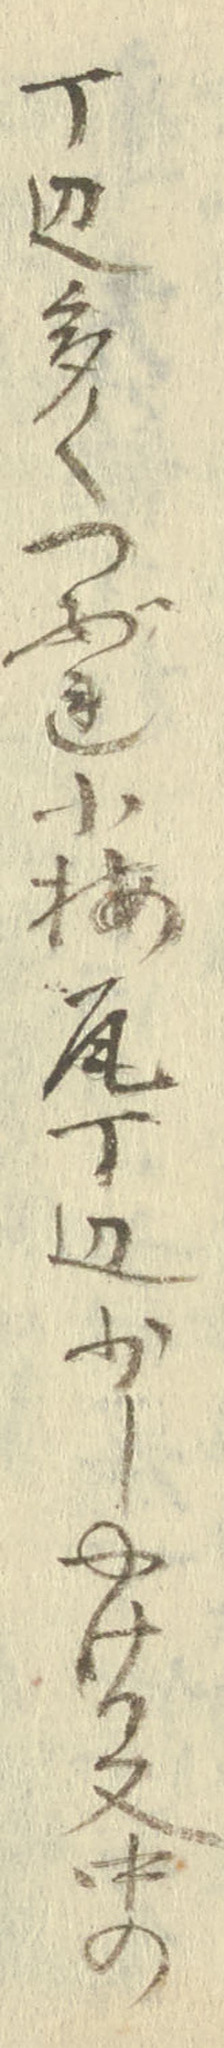丁辺多くつぶれ小梅瓦丁辺少しやける又中の
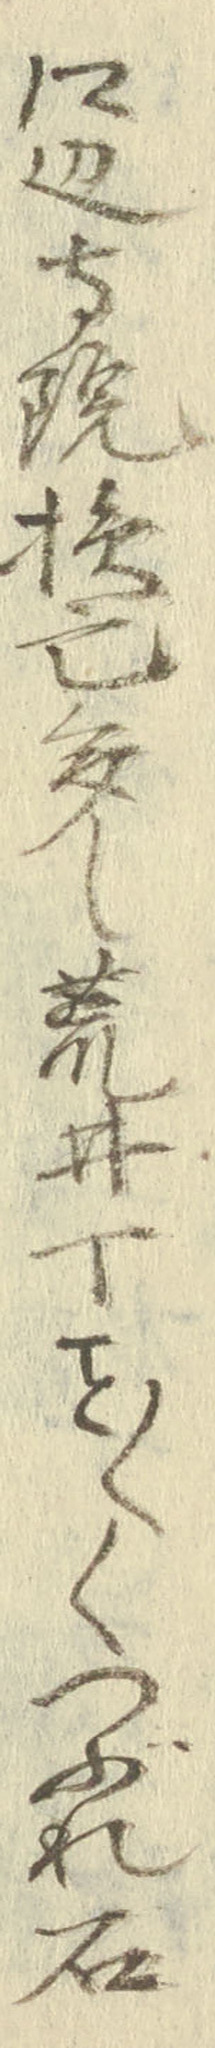郷辺寺院損亡多し荒井丁こと〳〵くつぶれ石
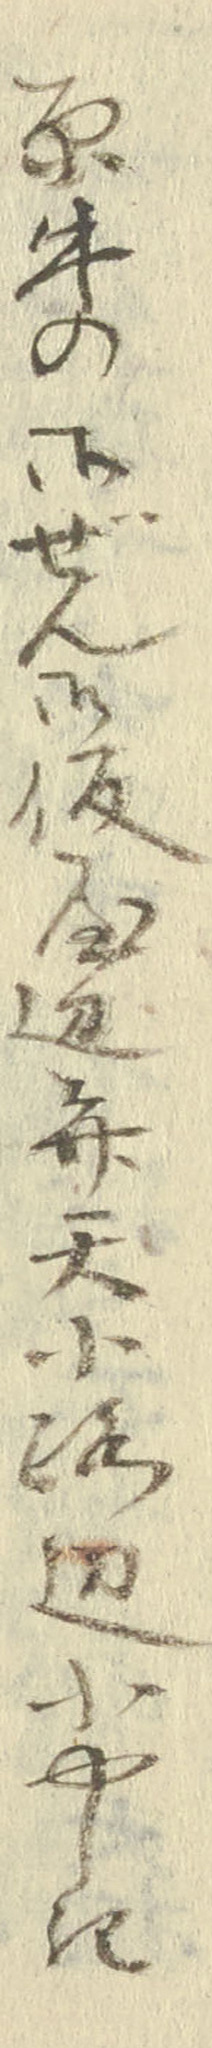原牛の御ぜん御仮屋辺并天小路辺小やき
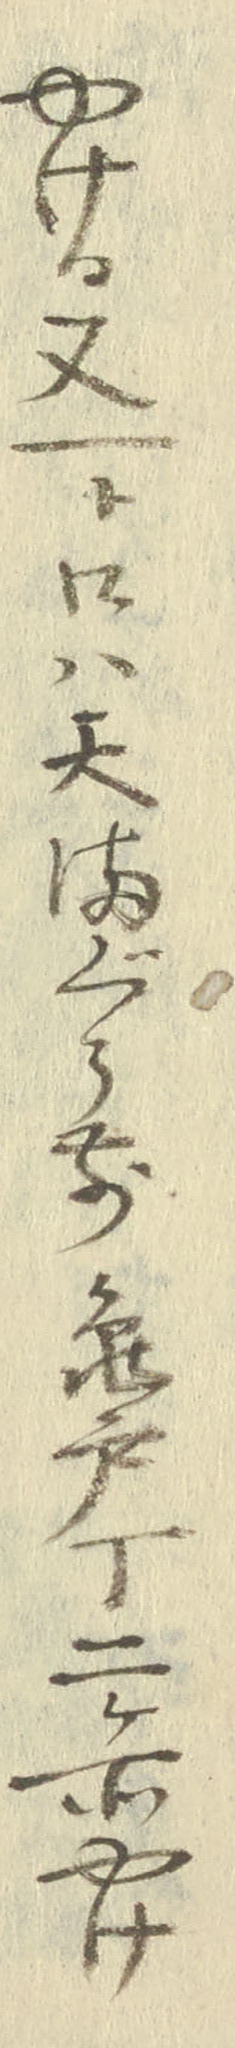やける又一ト口ハ天満宮前亀戸丁二ヶ所やけ
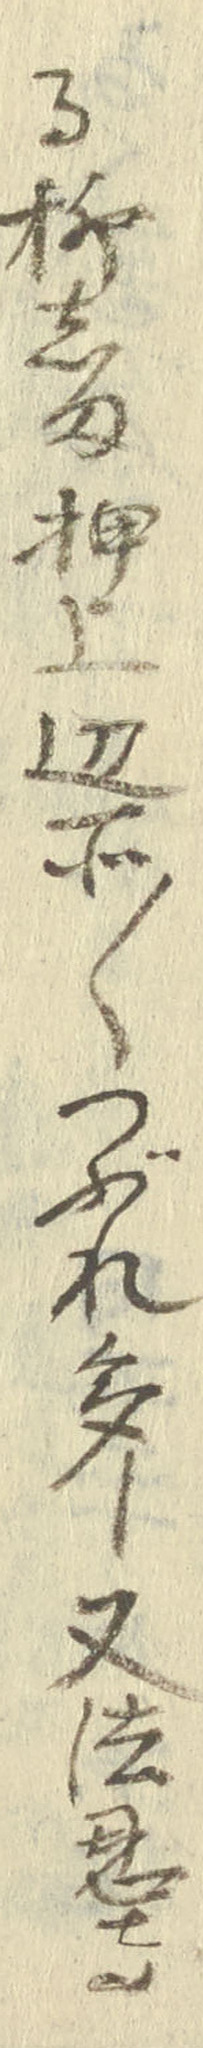る柳しま押上辺所〳〵つぶれ多し又法恩寺
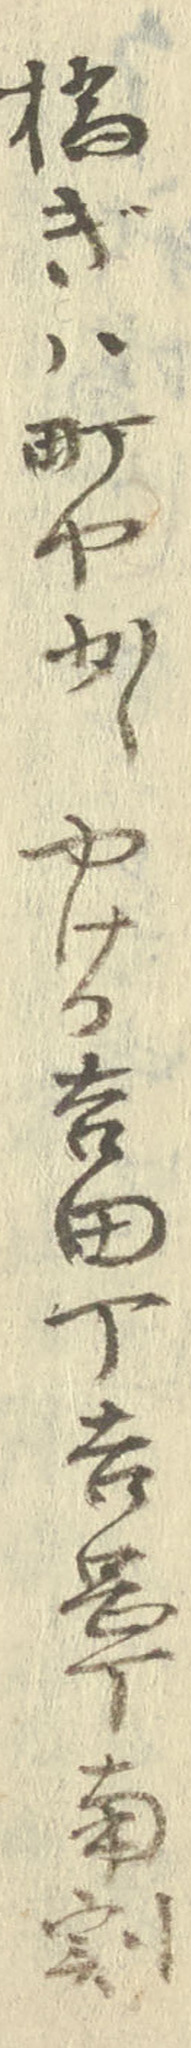橋ぎハ町ヤ少しやける吉田丁吉岡町南割
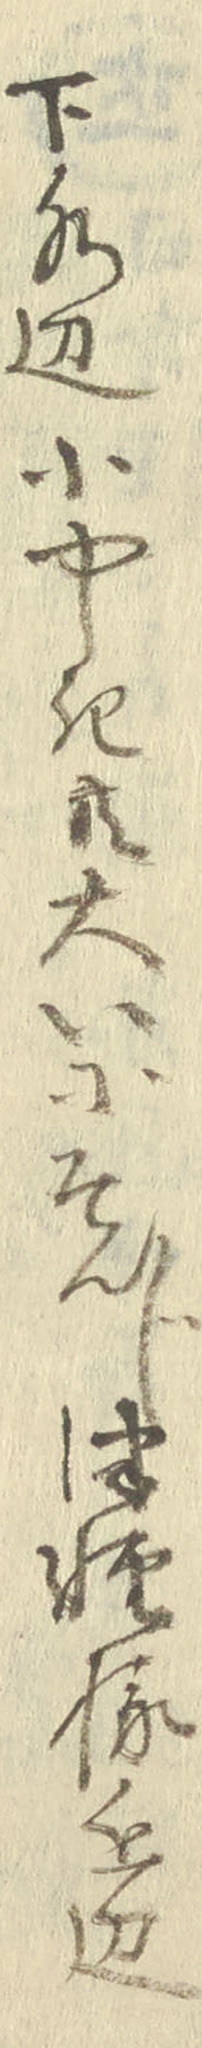下水辺小やき共大いにそんじ津軽様近辺
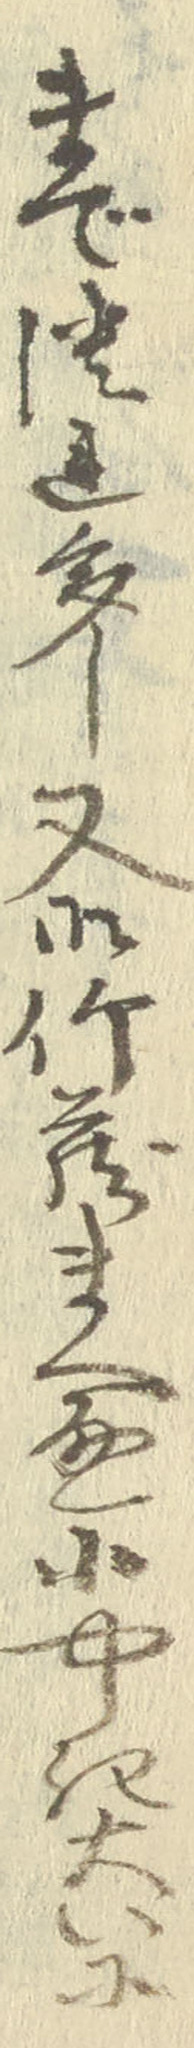まで潰れ多し又御竹蔵まへ通小やき大いに
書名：御府内御屋敷方市中共地震類焼場所明細書之冩兼街道筋近郷聞書
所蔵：東京大学総合図書館 General Library in the University of Tokyo, JAPAN
